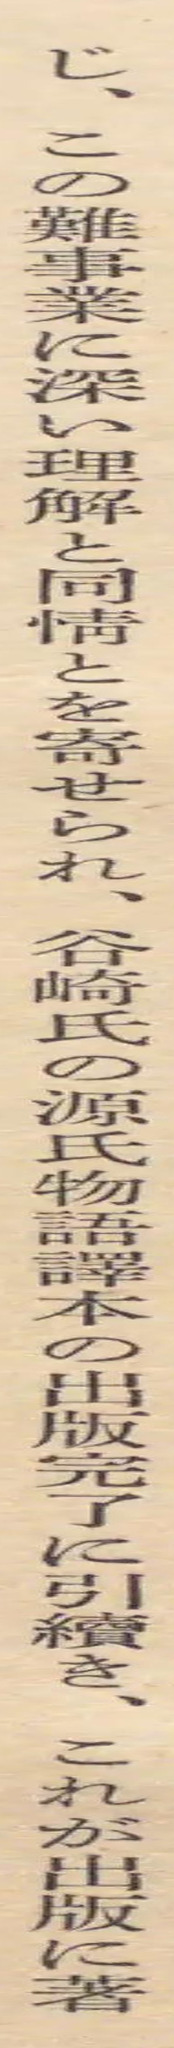じ、この難事業に深い理解と同情とを寄せられ、谷崎氏の源氏物語譯本の出版完了に引續き、これが出版に著
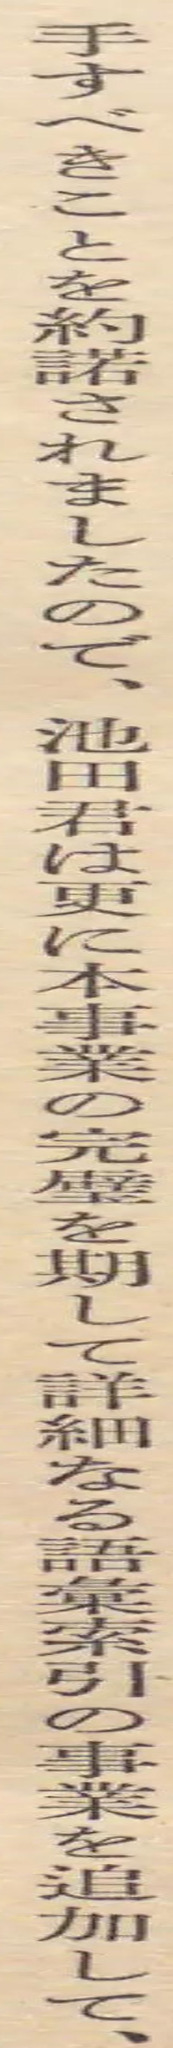手すべきことも約諾されましたので、池田君は更に本事業の完璧を期して詳細なる語彙索引の事業を追加して、
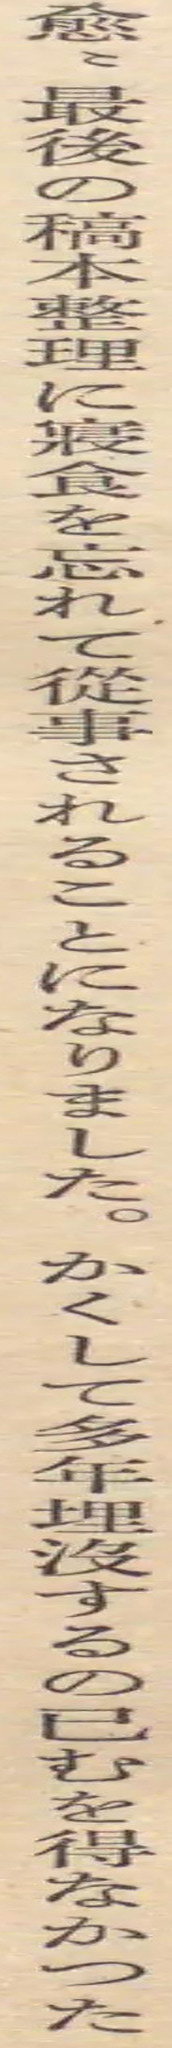愈〻最後の稿本整理に寢食を忘れて從事されることになりました。かくして多年埋沒するの已むを得なかつた
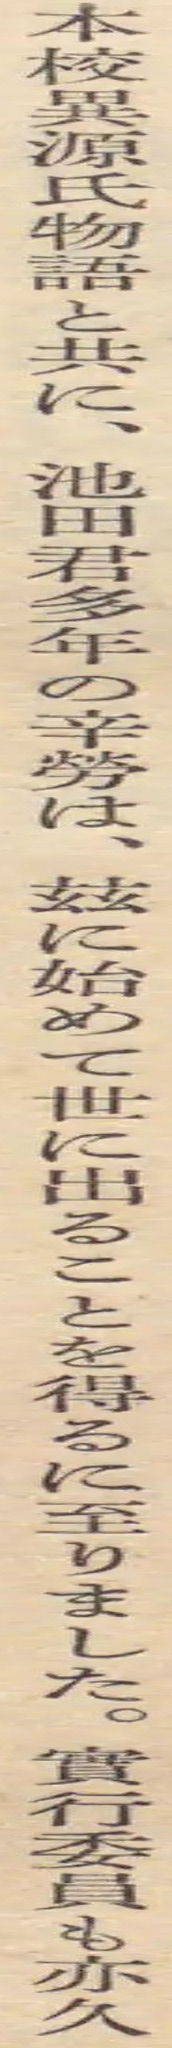本校異源氏物語と共に、池田君多年の辛勞は、玆に始めて世に出ることを得るに至りました。實行委員も亦久
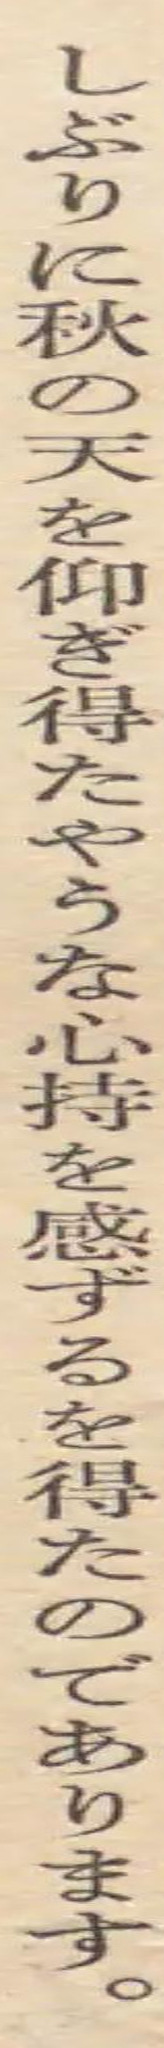しぶりに秋の天を仰ぎ得たやうな心持を感ずるを得たのであります。
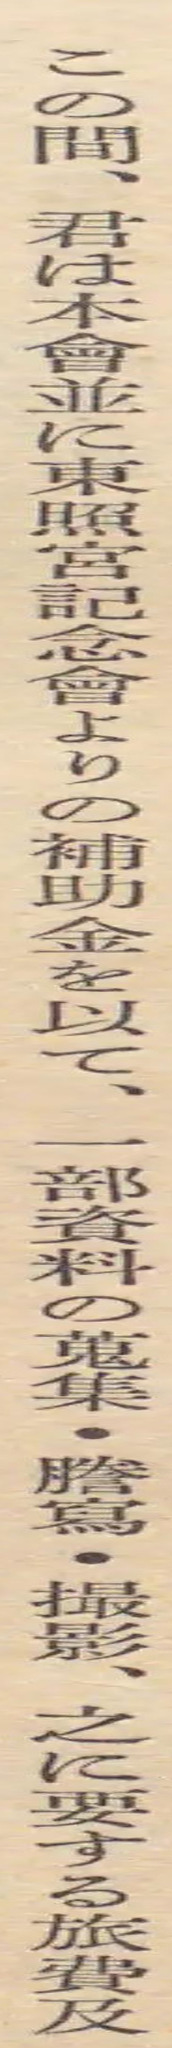この間、君は本會並に東照宮記念會よりの補助金を以て、一部資料の蒐集・謄寫・撮影、之に要する旅費及
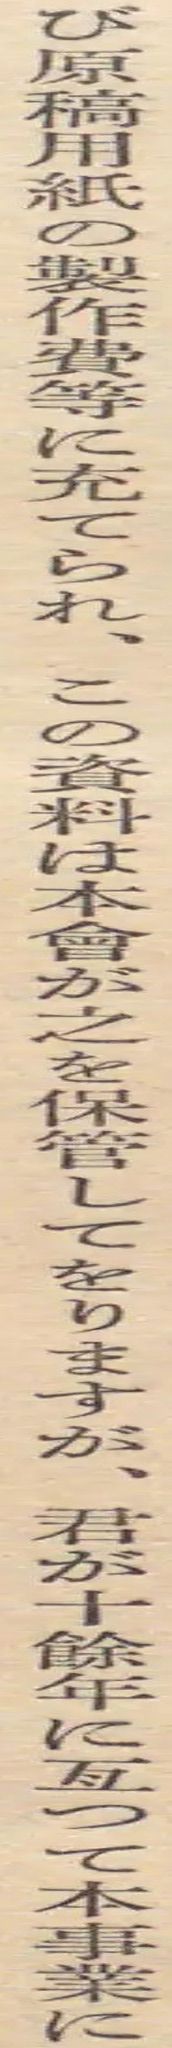び原稿用紙の製作費等に充てられ、この資料は本會が之を保管してをりますが、君が十餘年に亙つて本事業に
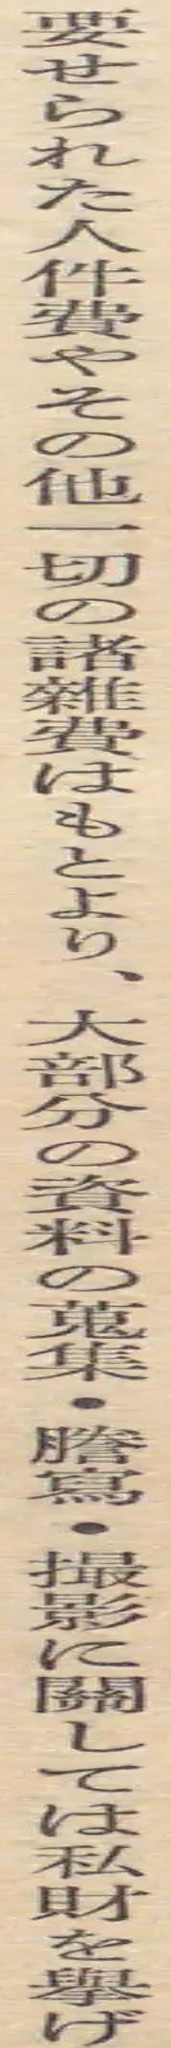要せられた人件費やその他一切の諸雜費はもとより、大部分の資料の蒐集・謄寫・撮影に關しては私財を擧げ
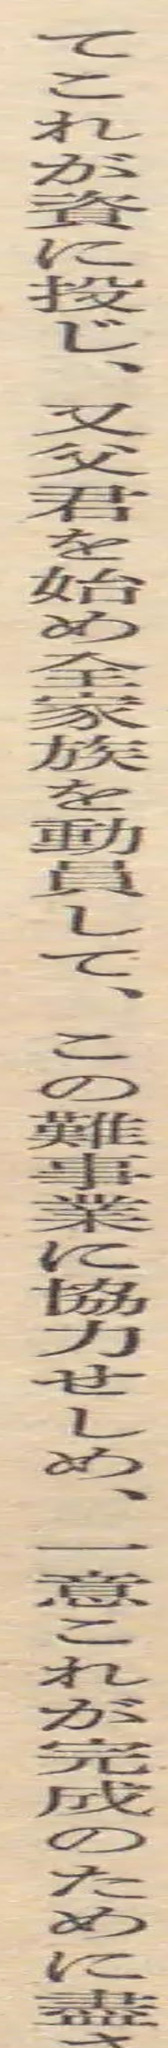てこれが資に投じ、又父君を始め全家族を動員して、この難事業に協力せしめ、一意これが完成のために盡さ
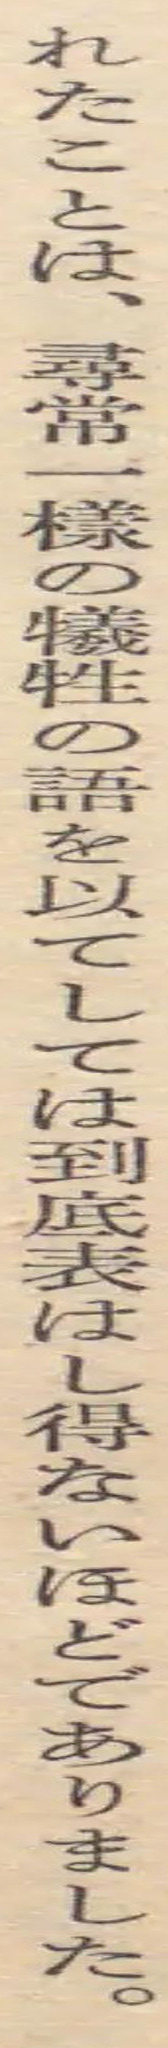れたことは、尋常一樣の犠牲の語を以てしては到底表はし得ないほどでありました。
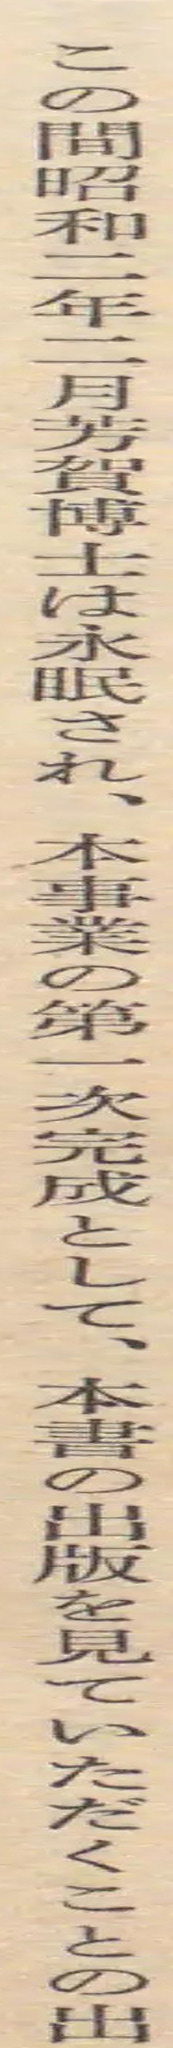この間昭和二年二月芳賀博士は永眠され、本事業の第一次完成として、本書の出版を見ていただくことの出
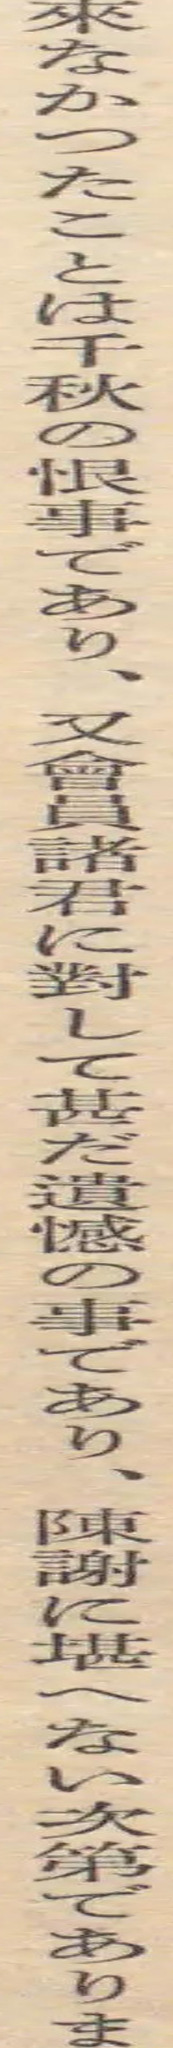來なかつたことは千秋の恨事であり、又會員諸君に對して甚だ遺憾の事であり、陳謝に堪へない次第でありま
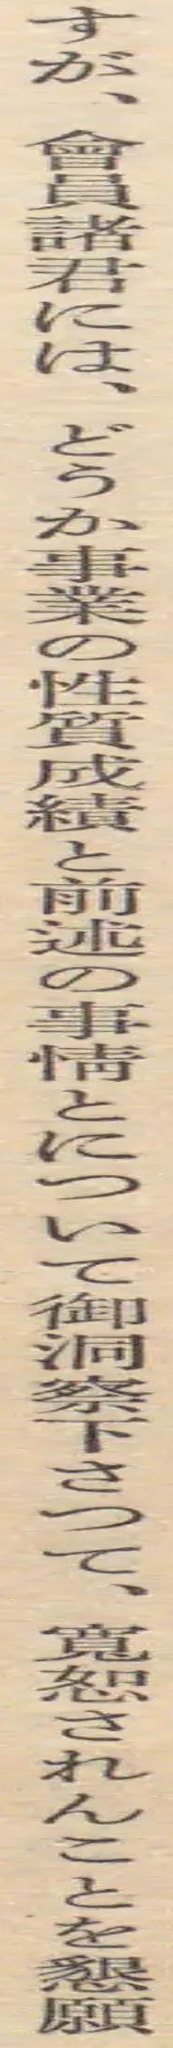すが、會員諸君には、どうか事業の性質成績と前述の事情とについて御洞察下さつて、寬恕されんことを懇願
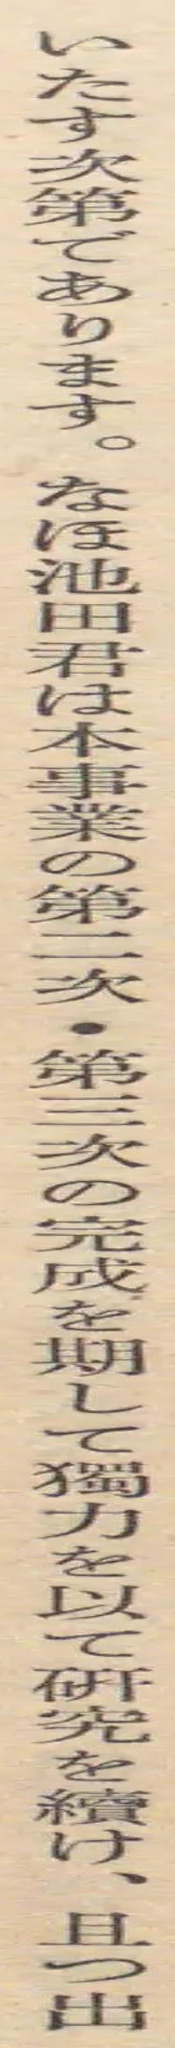いたす次第であります。なほ池田者は本事業の第二次・第三次の完成を期して獨力を以て硏究を續け、且つ出
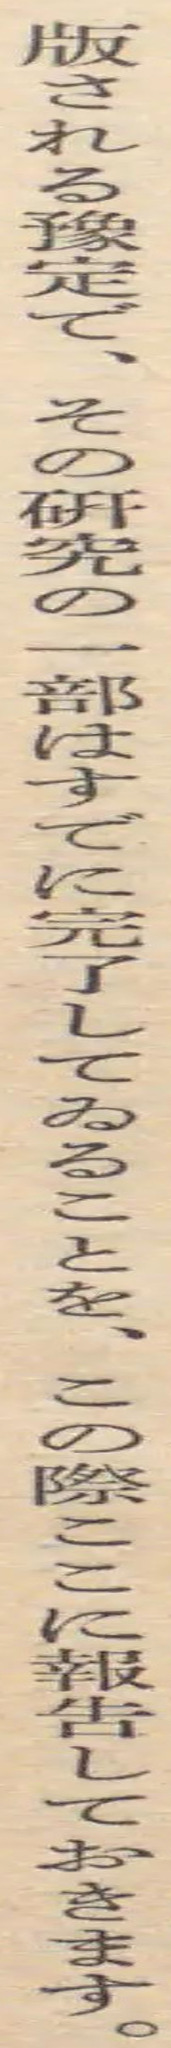版される豫定で、その硏究の一部はすでに完丁してゐることを、この際ここに報告しておきます。
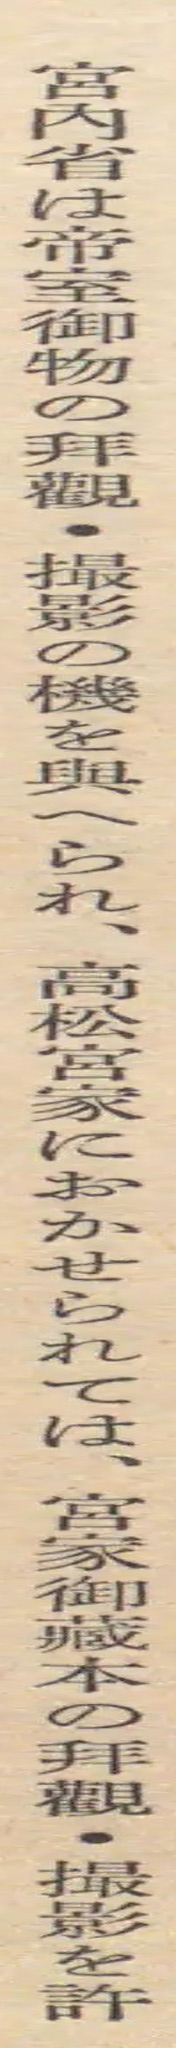宮内省は帝室御物の拜觀・撮影の機を與へられ、高松宮家におかせられては、宮家御藏本の拜觀・撮影を許
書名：校異源氏物語.
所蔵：国立国会図書館 National Diet Library, JAPAN
